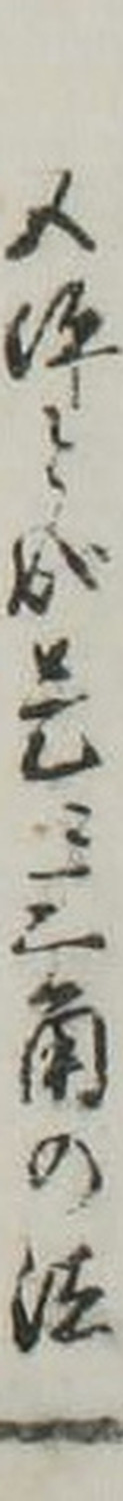五坪と成是に三角の法
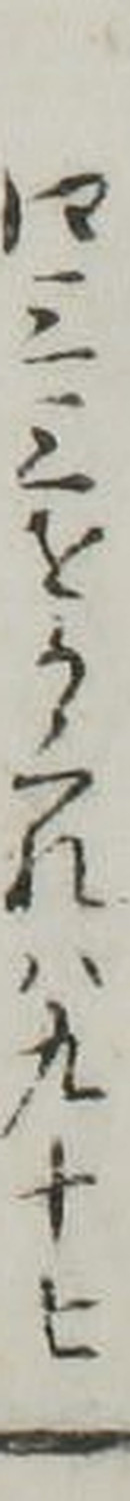間四三三をかくれは九十七
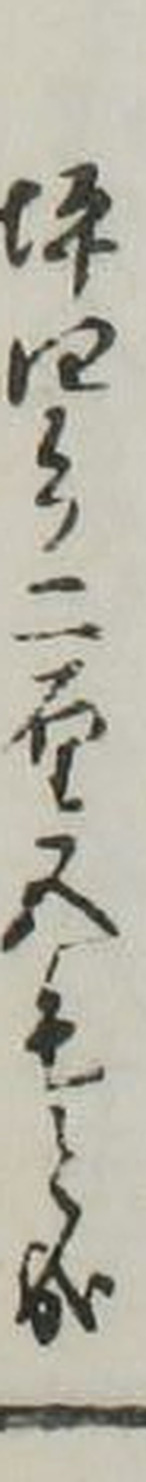五坪四分二厘五毛と成
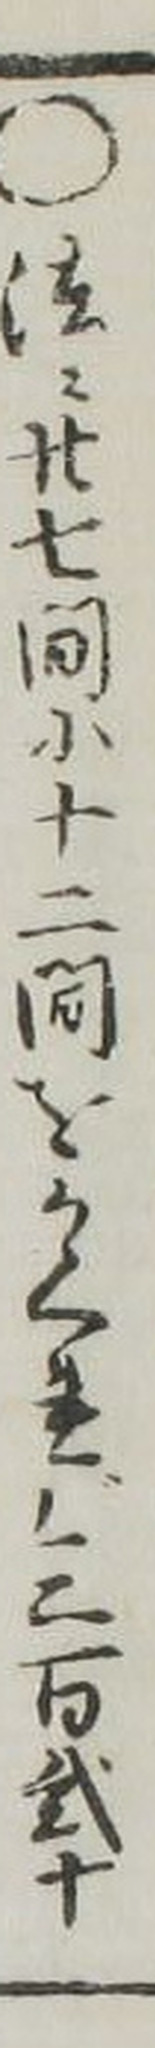○法に廿七間に十二間をかくれば三百弐十
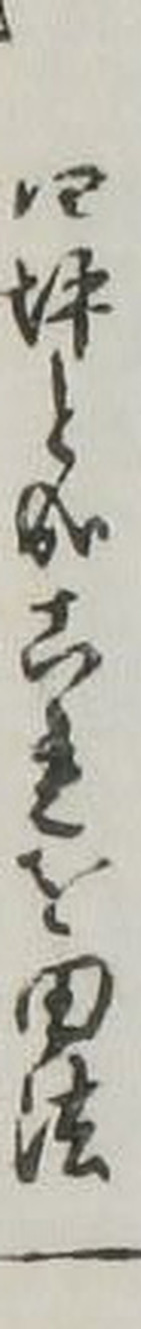四坪と成これを田法
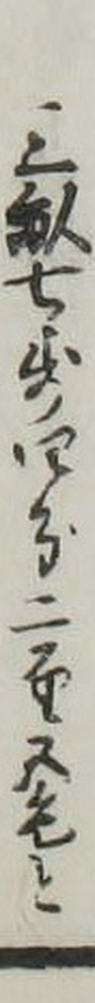同三畝七歩四分二厘五毛と
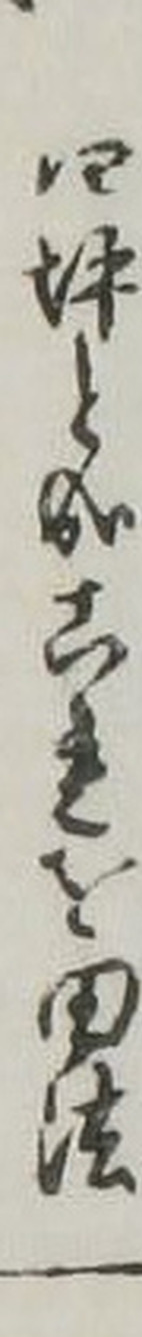四坪と成これを田法
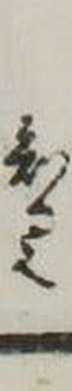知る也
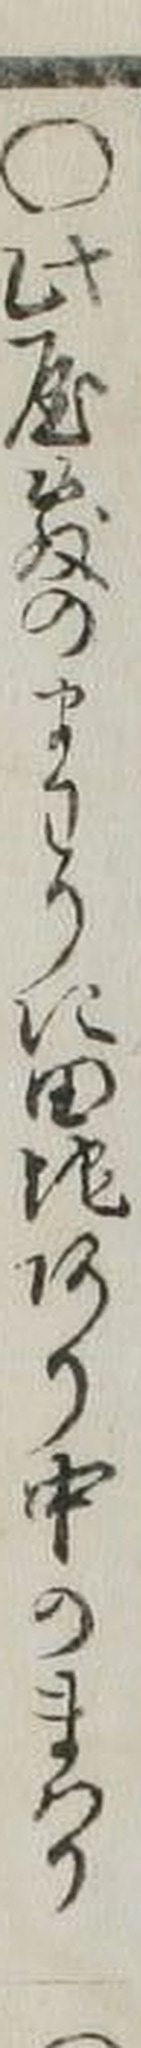○此屋敷のまわりに田地あり中のまはり
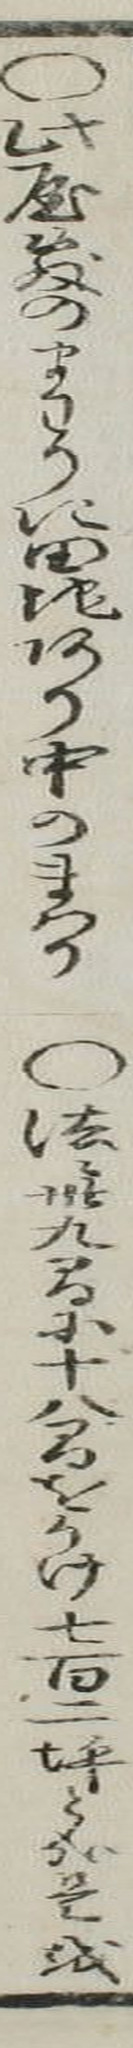○此屋敷のまわりに田地あり中のまはり
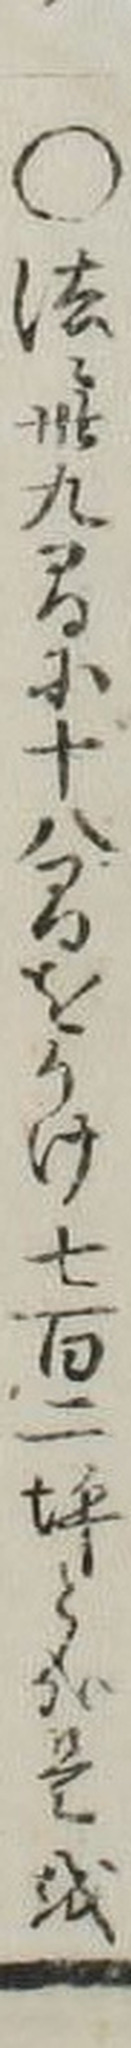○法に卅九間に十八間をかけ七百二坪と成是を
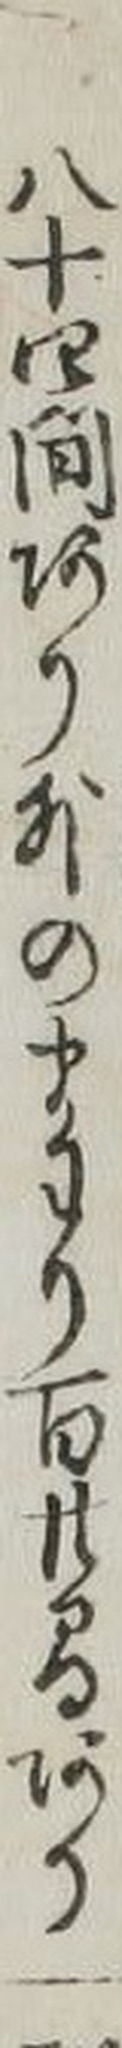八十四間あり外のまわり百廿間あり
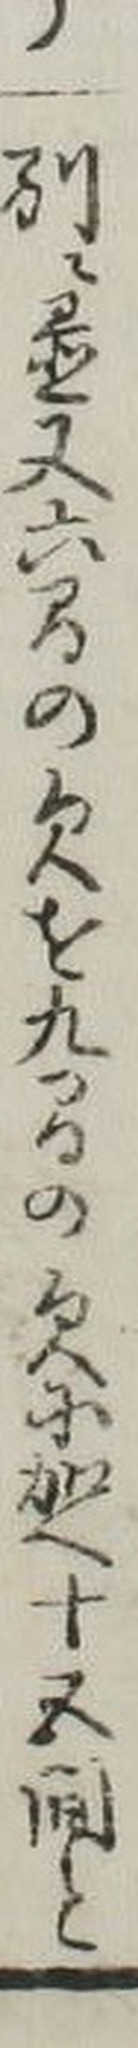別に置又六間の欠を九間の欠に加へ十五間と
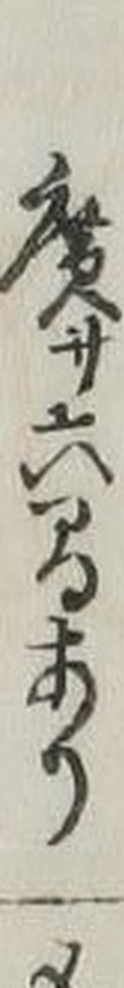広サ六間あり
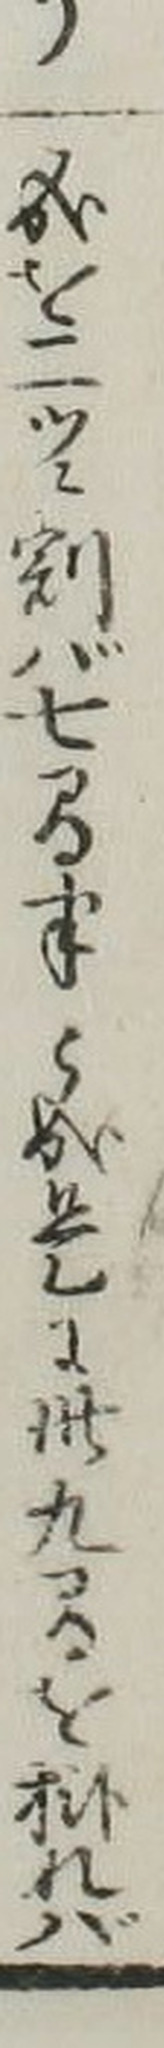成を二ツに割ば七間半と成是に卅九間を掛れば
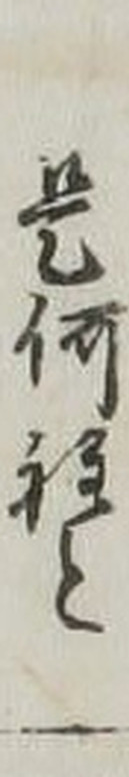是何程と
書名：宝玉塵劫記
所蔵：東京学芸大学教育コンテンツアーカイブ
